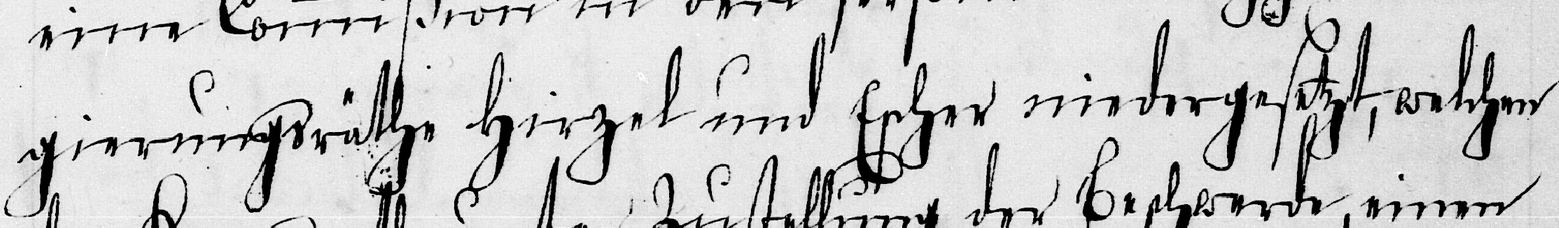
gierungsräthe Hirzel und Escher niedergesetzt, welchen
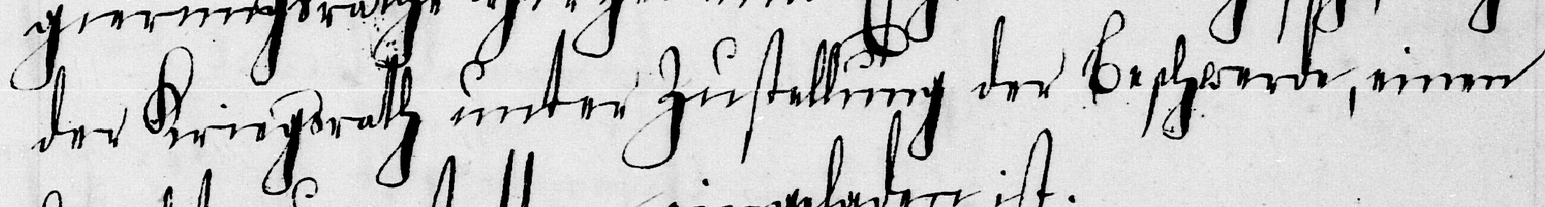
der Kriegsrath unter Zustellung der Beschwerde, einen
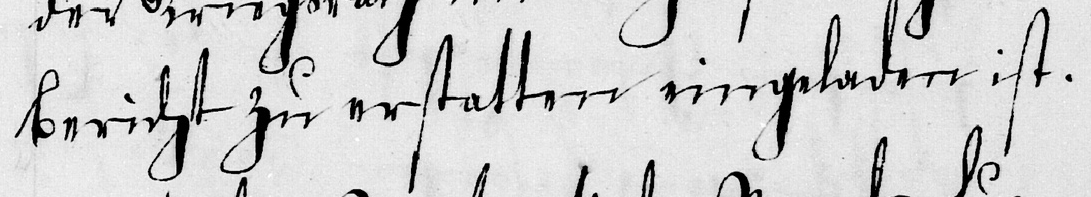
Bericht zu erstatten eingeladen ist.
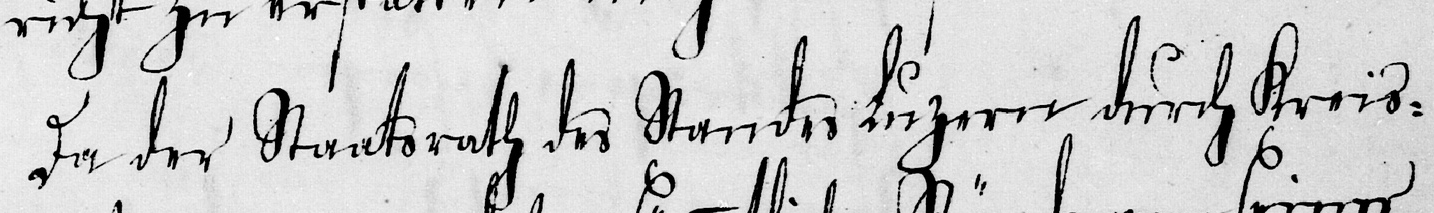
Da der Staatsrath des Standes Luzern durch Kreis¬
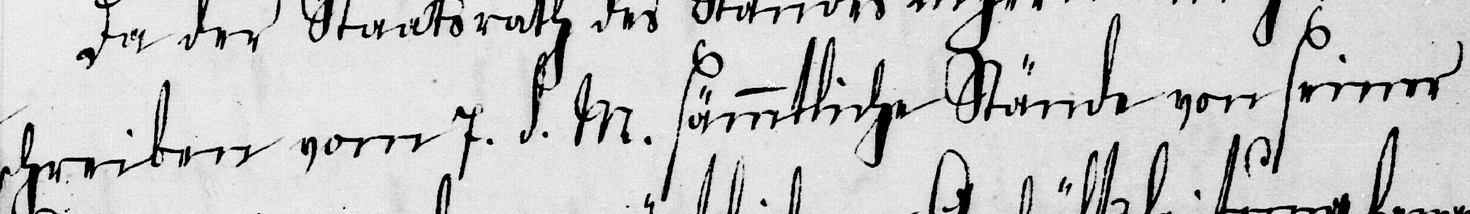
chreiben vom 7. d. M. sämmtliche Stände von seiner
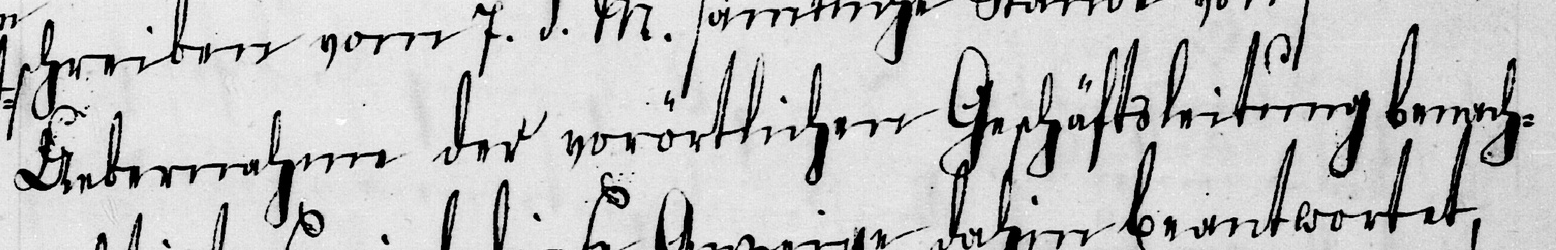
Uebernahme der vorörtlichen Geschäftsleitung benach¬
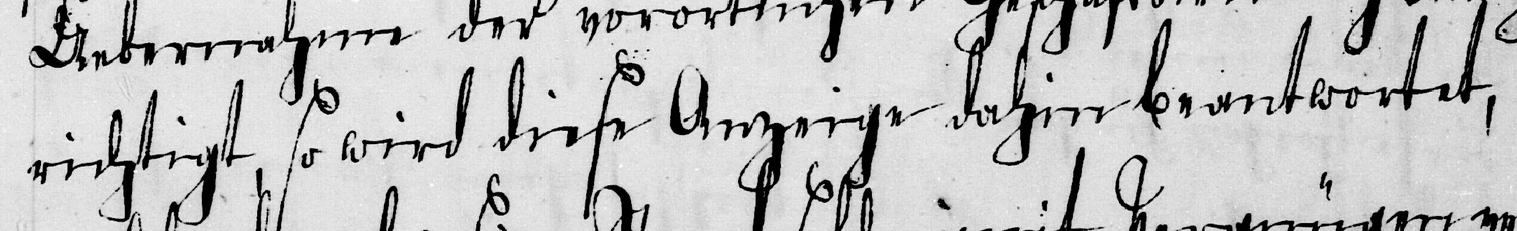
richtigt, so wird diese Anzeige dahin beantwortet,
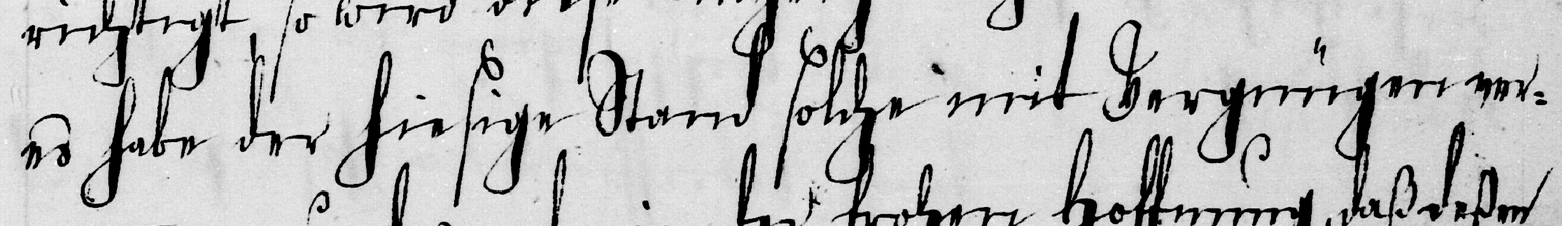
es habe der hiesige Stand solche mit Vergnügen ver¬
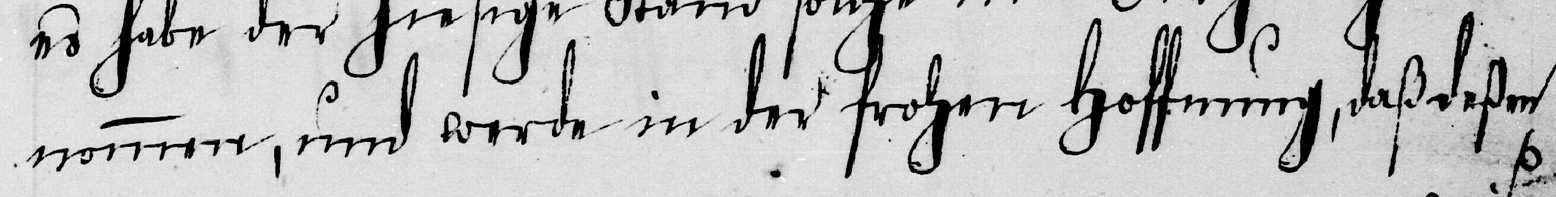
nommen, und werde in der frohen Hoffnung, daß deßen
